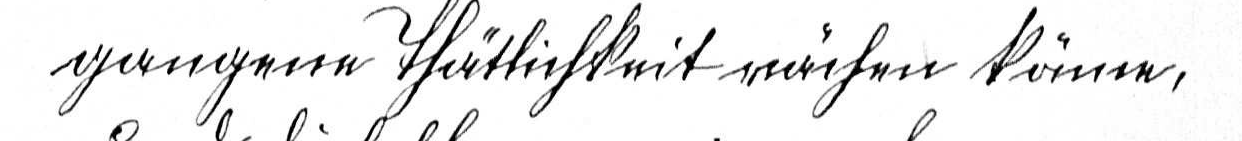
gangene Thätigkeit rächen könne,
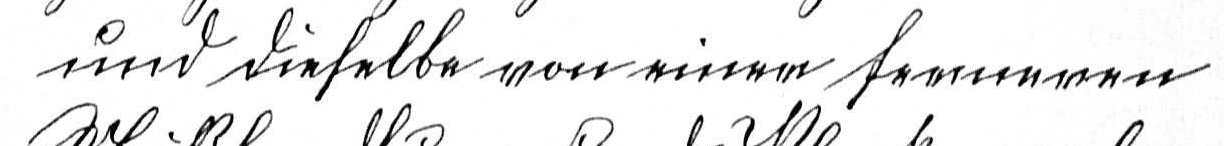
und dieselbe von einer ferneren
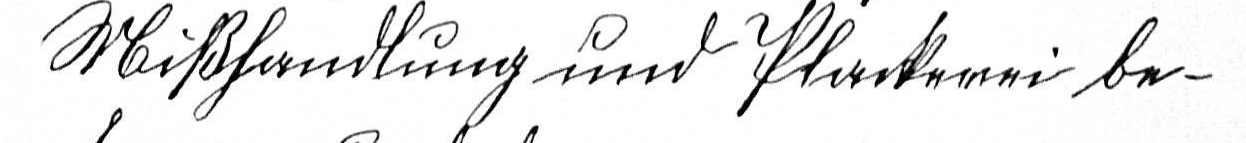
Mißhandlung und Plackerei be¬
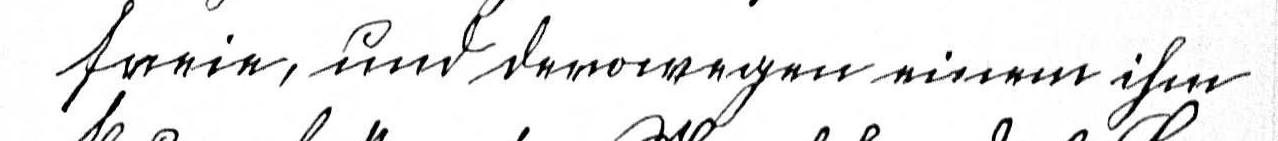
freie, und derawegen einem ihm
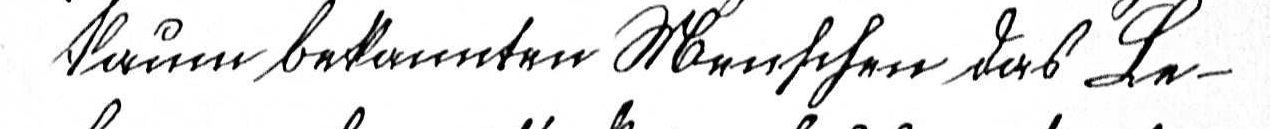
kaum bekannten Menschen das Le¬
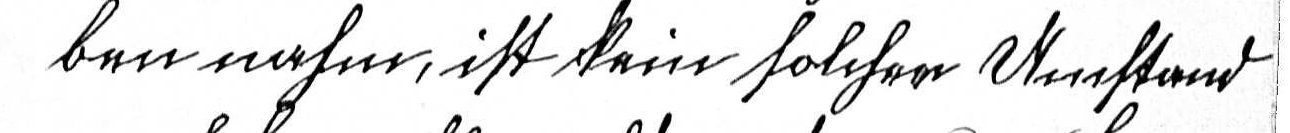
ben nahm, ist kein solcher Umstand
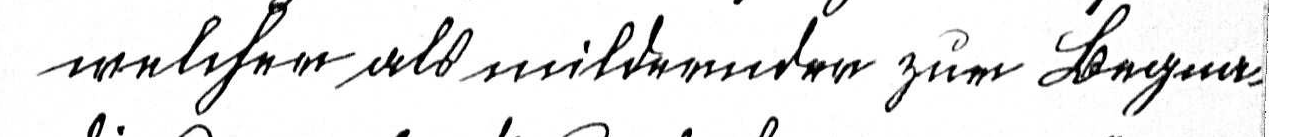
welcher als mildernder zu Begna¬
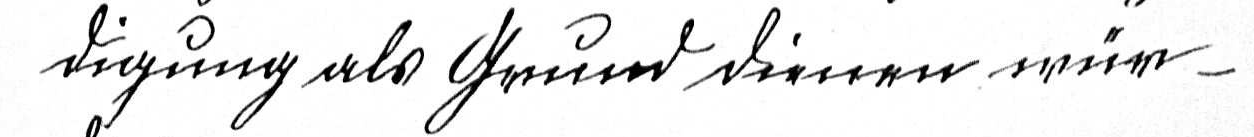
digung als Grund dienen wür¬
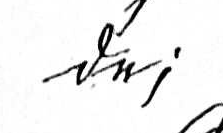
de;
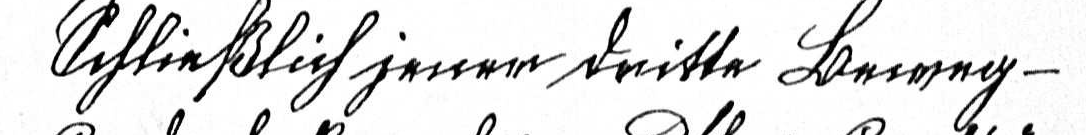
Schließlich jener dritte Beweg¬
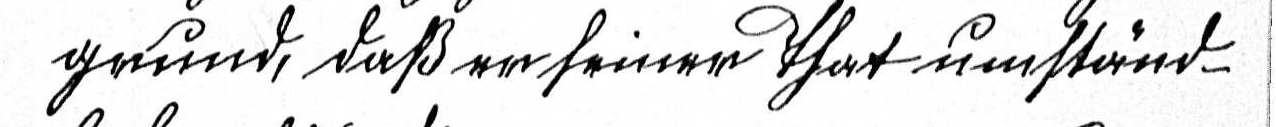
grund, daß er seiner That umständ¬
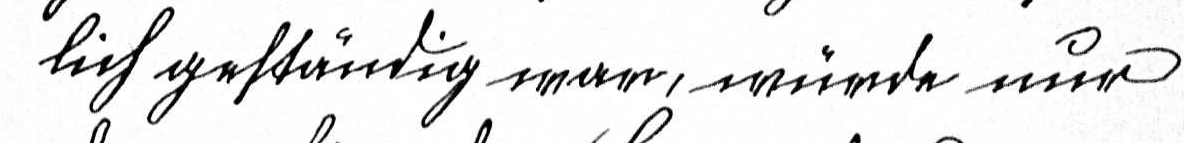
lich geständig war, würde nur
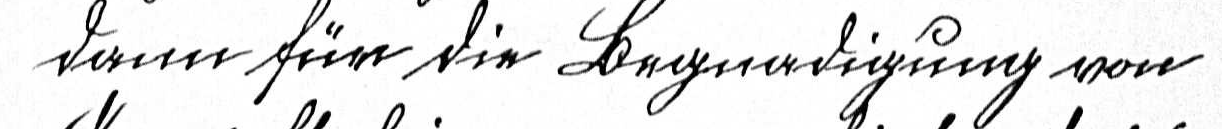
dann für die Begnadigung von
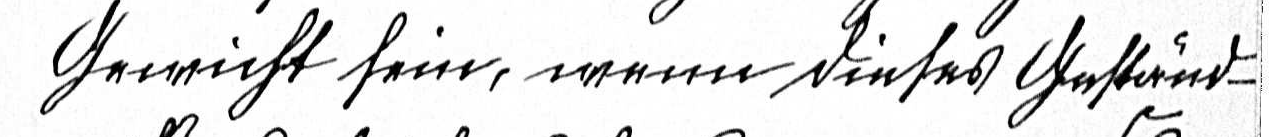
Gewicht sein, wenn dieses Geständ¬
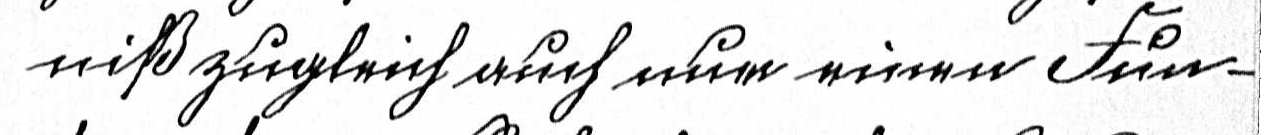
niß zugleich auch nur einen Fun¬
